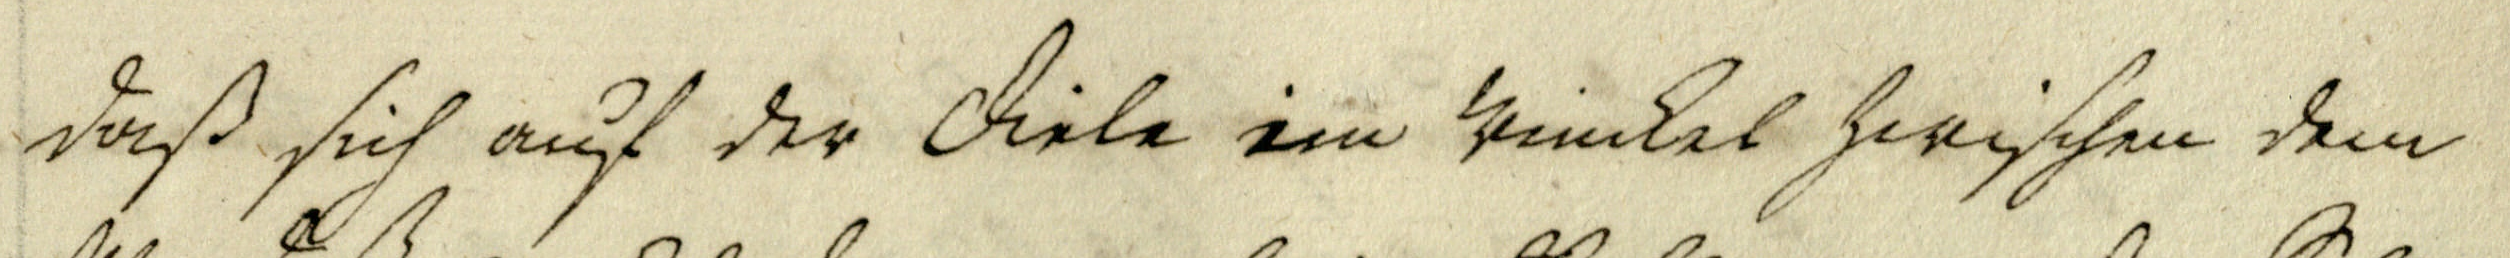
daß sich auf der Diele im Winckel zwischen dem
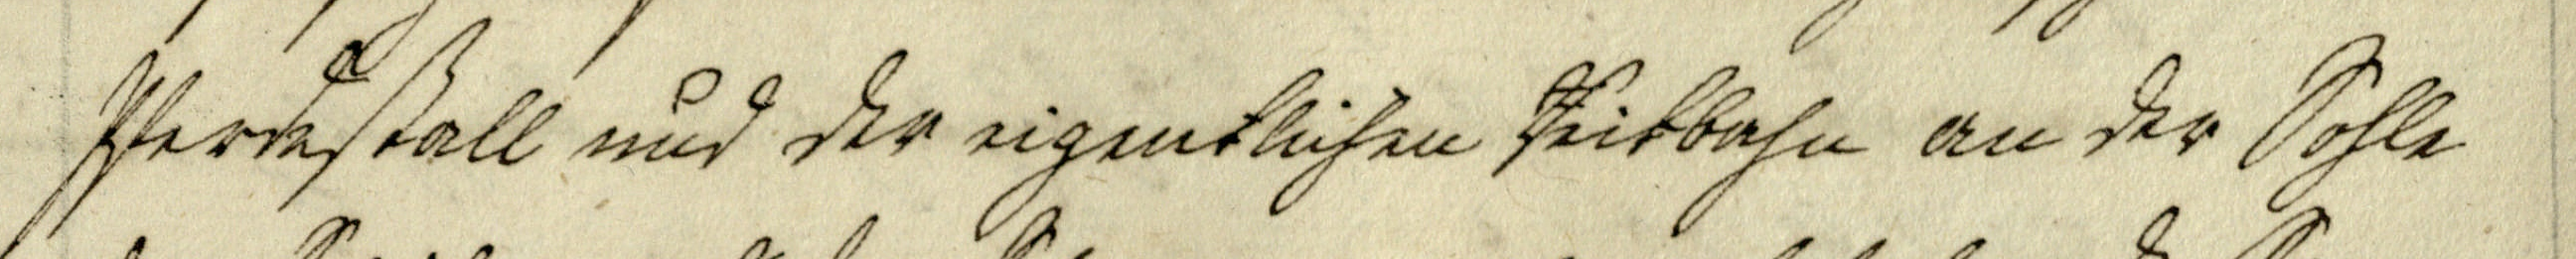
Pferdestall und der eigentlichen Reitbahn an der Sohle
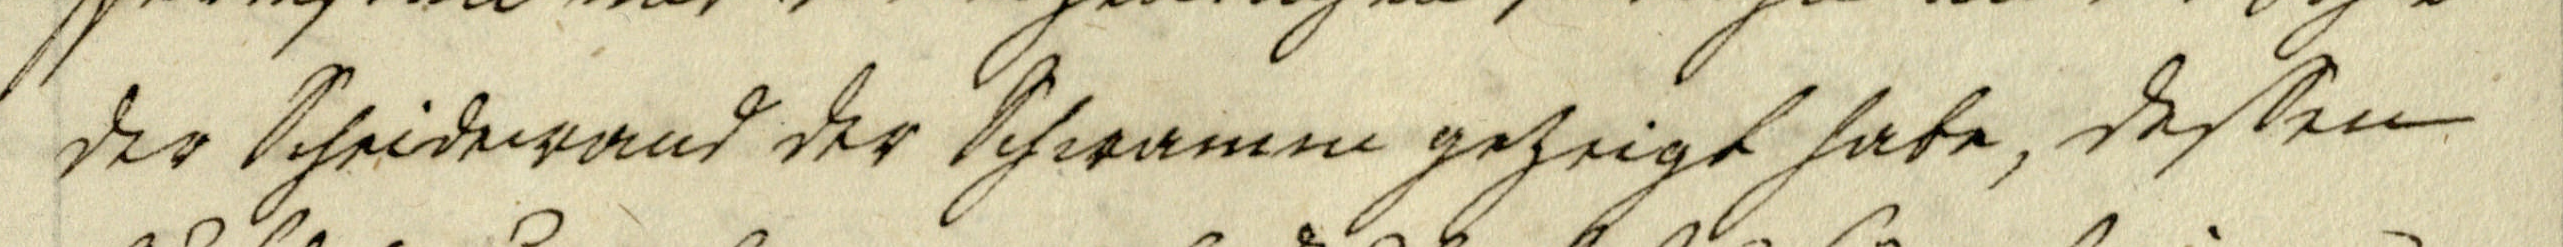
der Scheidewand der Schwamm gezeigt habe, dessen
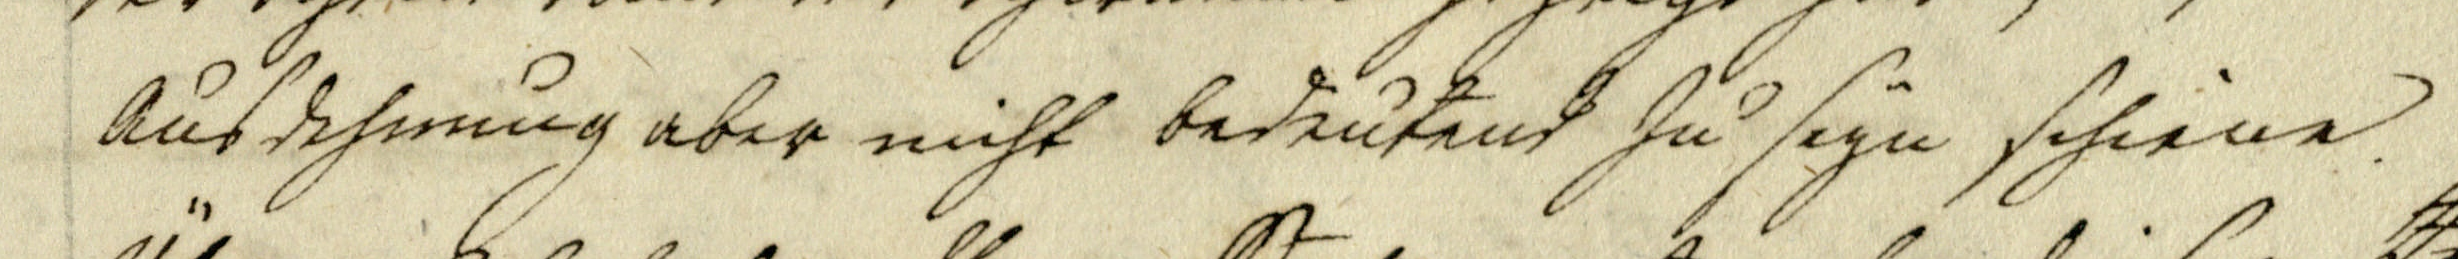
Ausdehnung aber nicht bedeutend zu seÿn schiene.
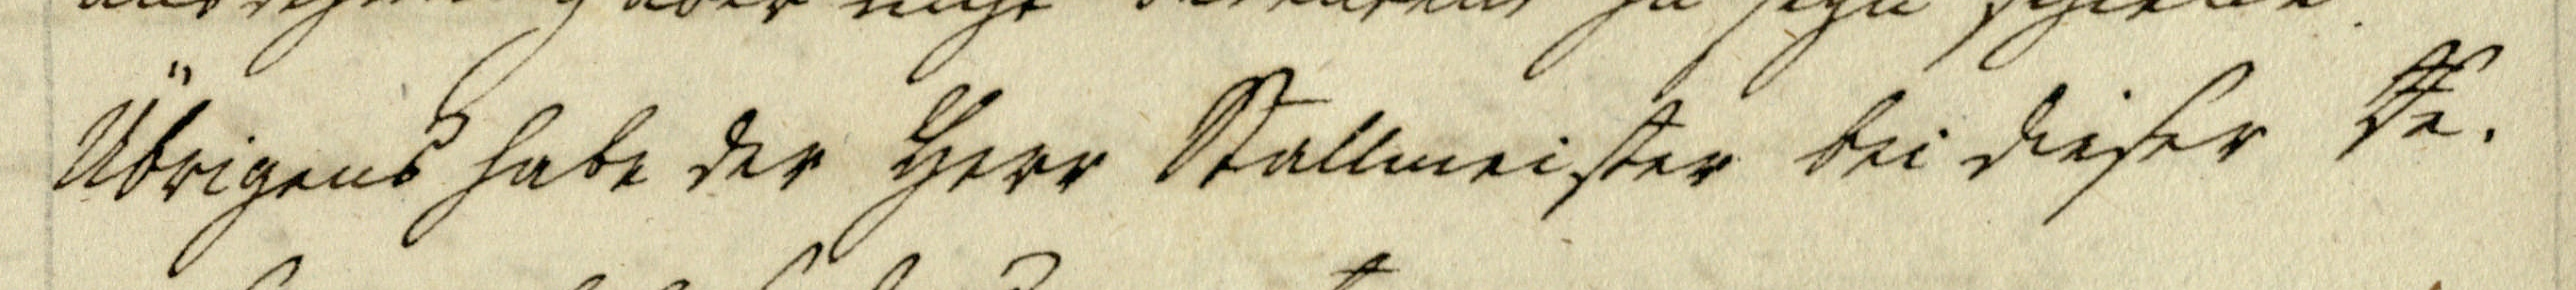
Übrigens habe der Herr Stallmeister bei dieser Re¬
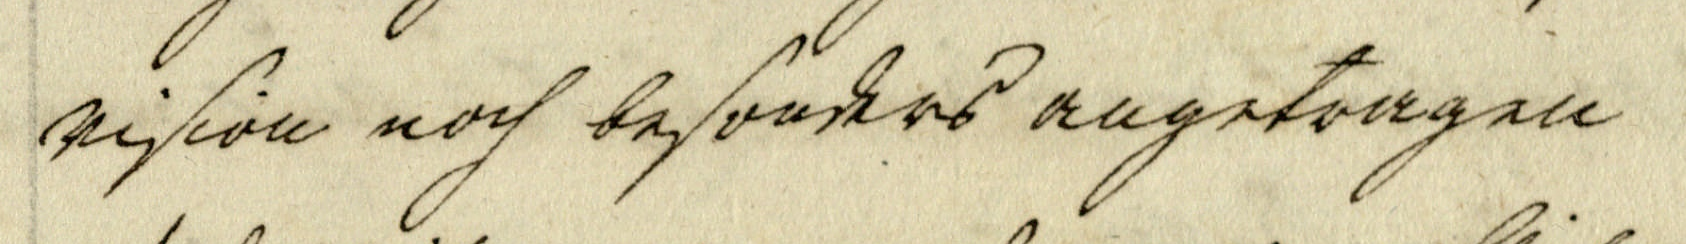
vision noch besonders angetragen
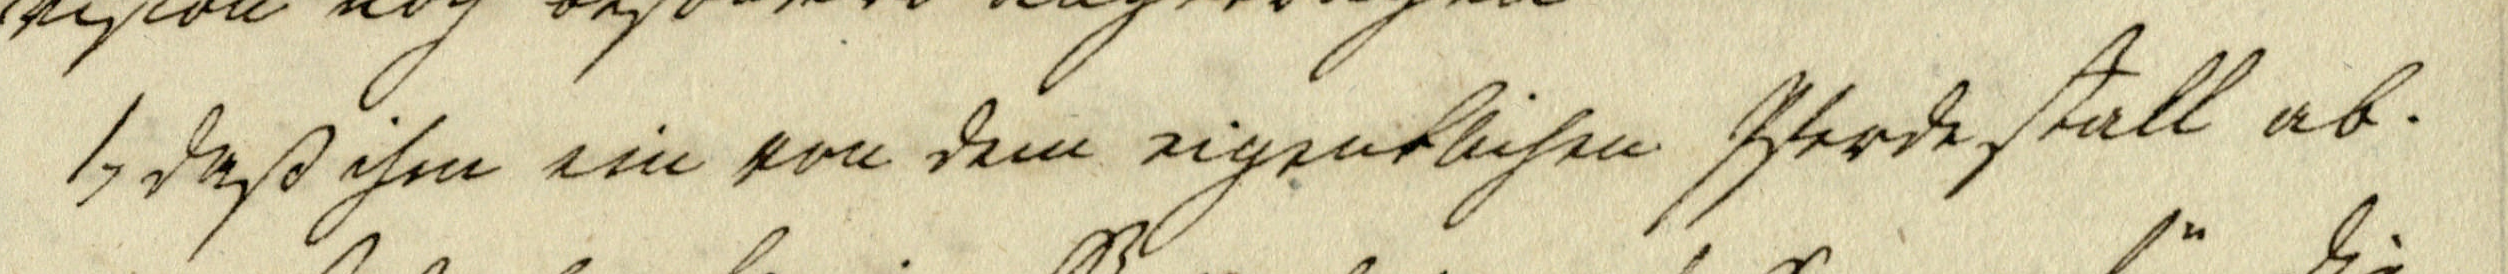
1., daß ihm ein von dem eigentlichen Pferdestall ab¬
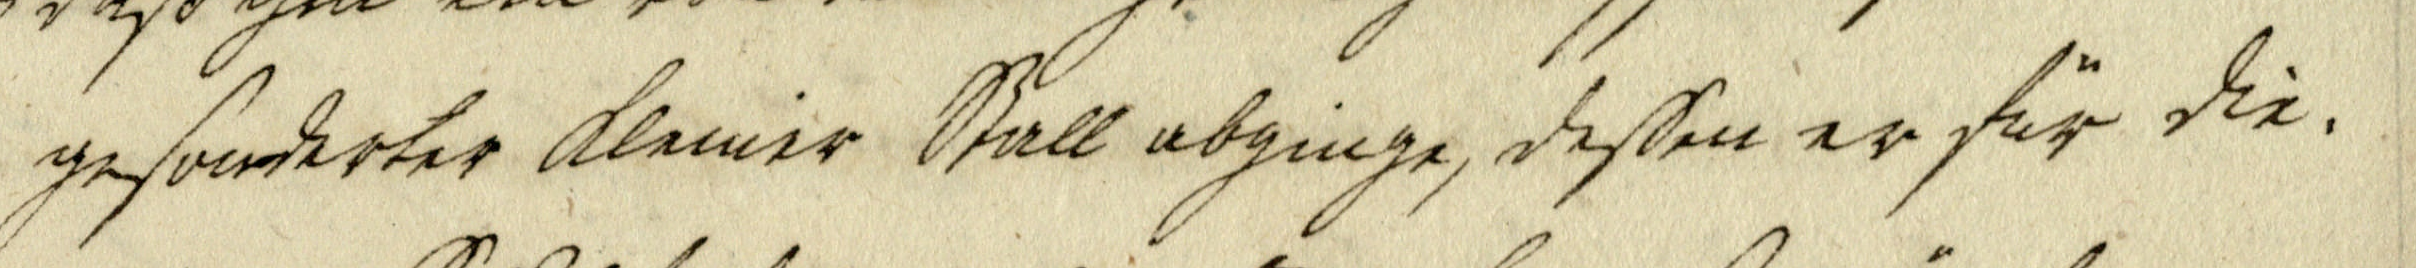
gesonderter kleiner Stall abginge, dessen er für die¬
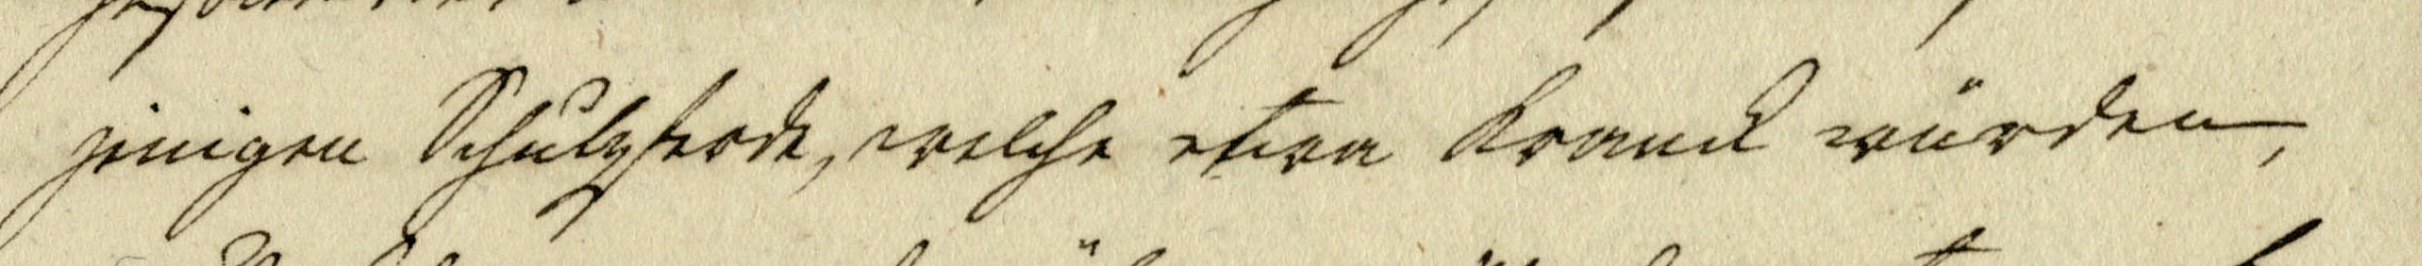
jenigen Schulpferde, welche etwa kranck würden
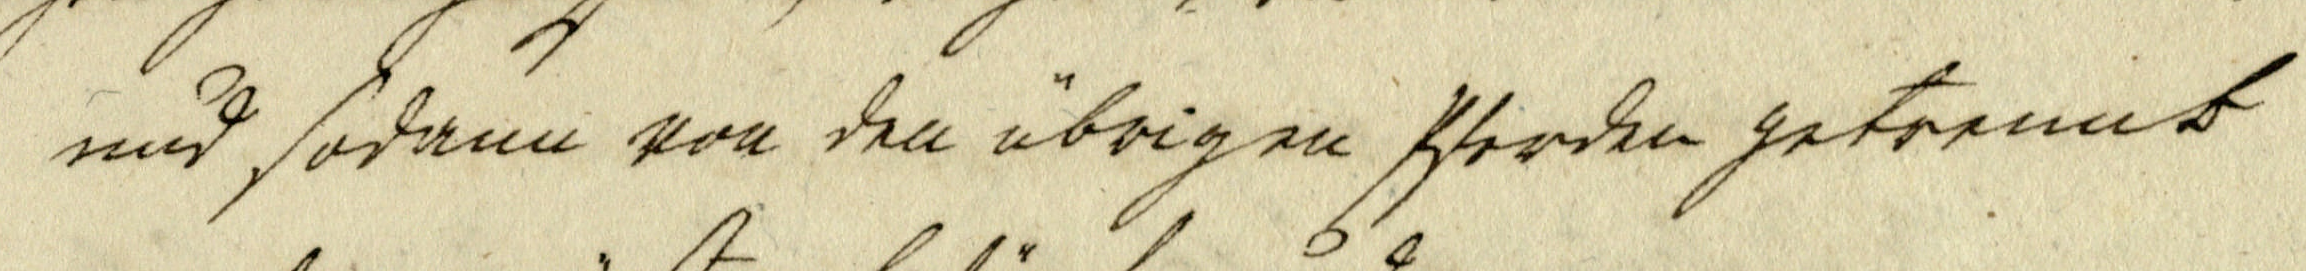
und sodann von den übrigen Pferden getrennt
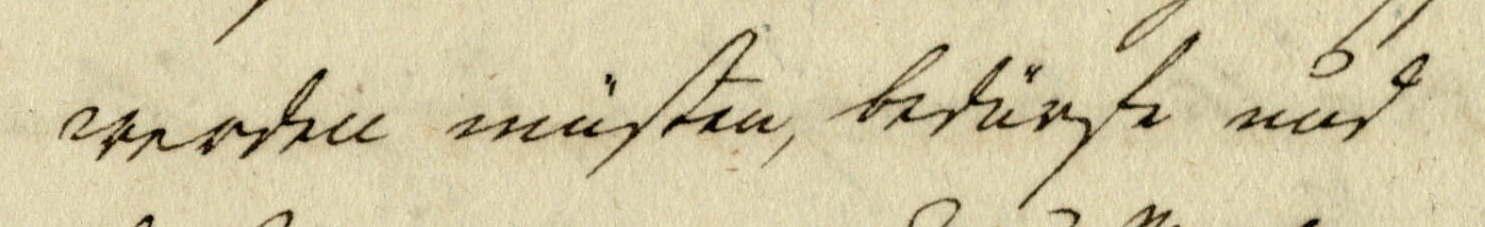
werden müßten, bedürfe und
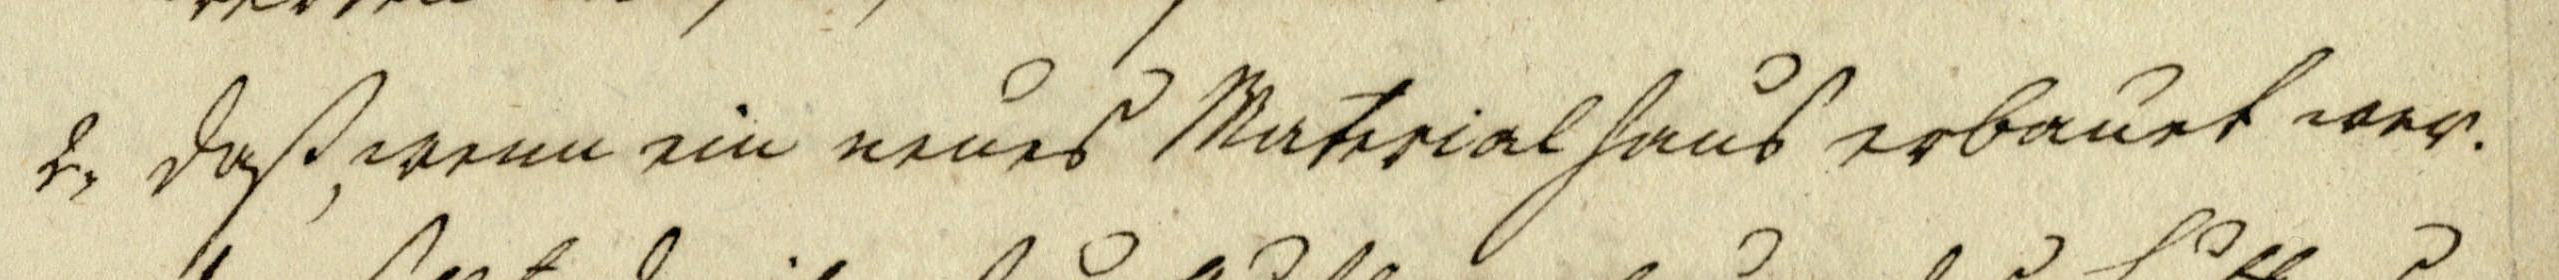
2, daß wenn ein neues Materialhaus erbauet wer¬
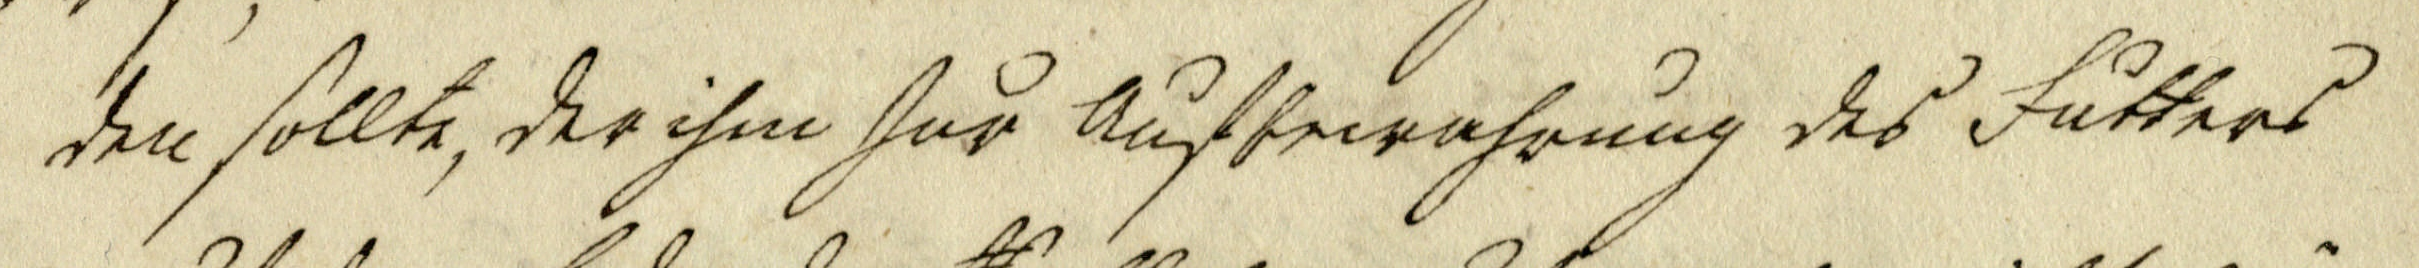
den sollte, der ihm zur Aufbewahrung des Futters
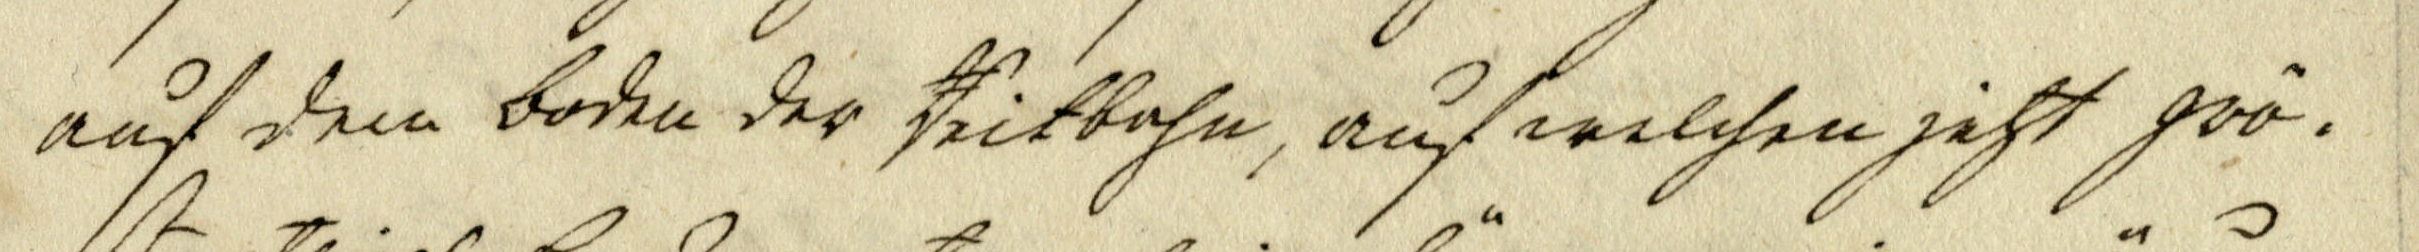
auf dem Boden der Reitbahn, auf welchen jetzt grö¬
